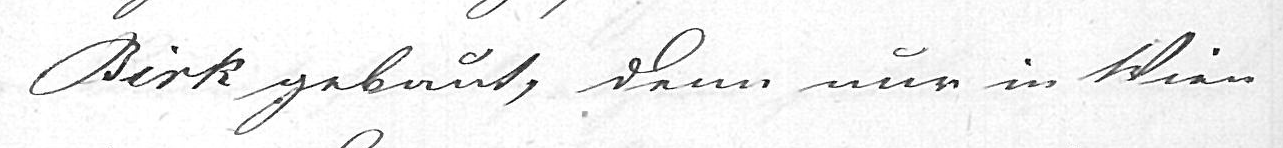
Birk gebaut, denn nur in Wien
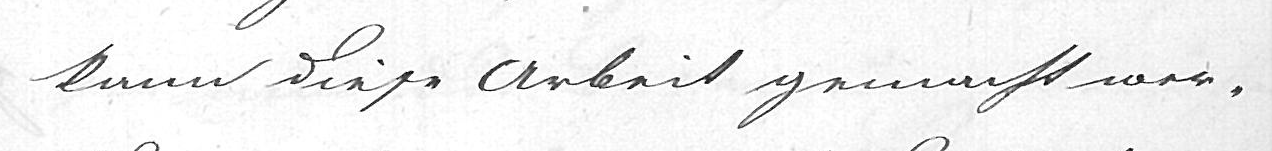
kann diese Arbeit gemacht wer-
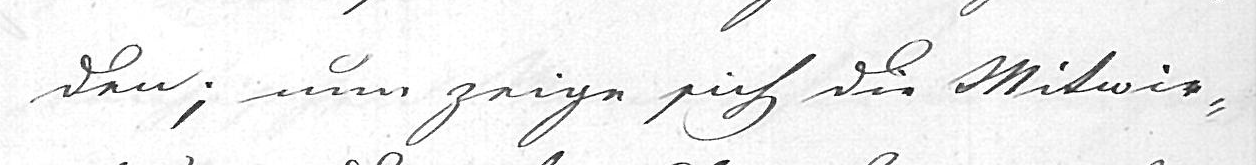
den; nun zeigen sich die Mitwir-
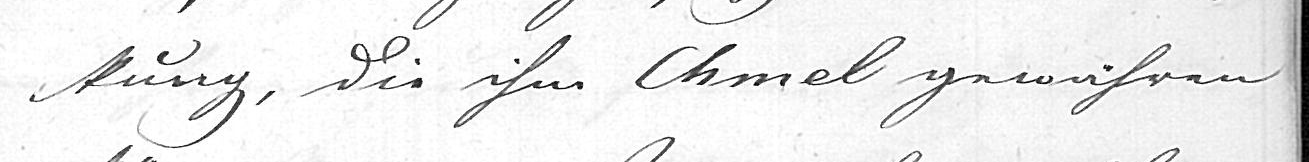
kung, die ihm Chmel gewähren
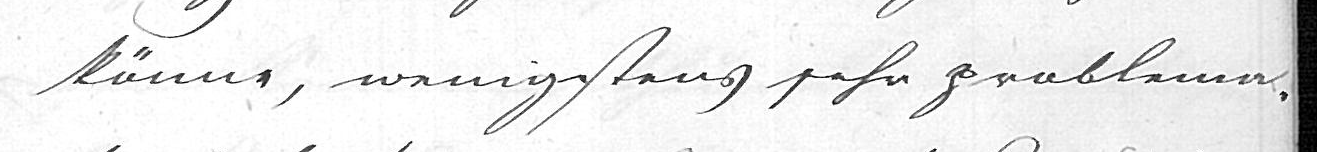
könne, wenigstens sehr problema-
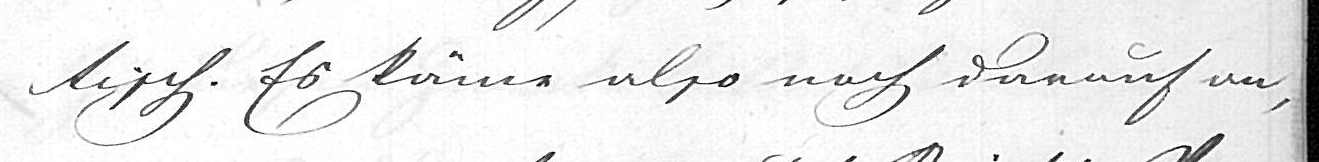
tisch. Es käme also noch darauf an,
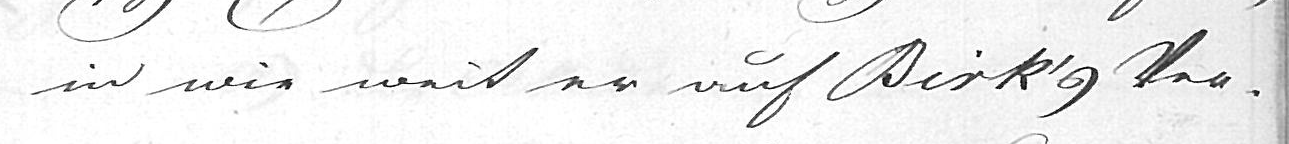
in wie weit er auf Birk's Ver-
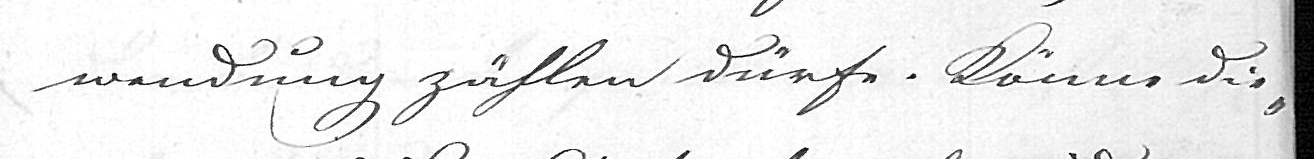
wendung zählen dürfe. Könne die-
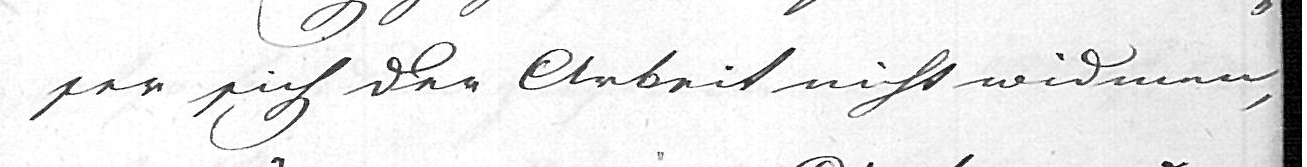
ser sich der Arbeit nicht widmen,
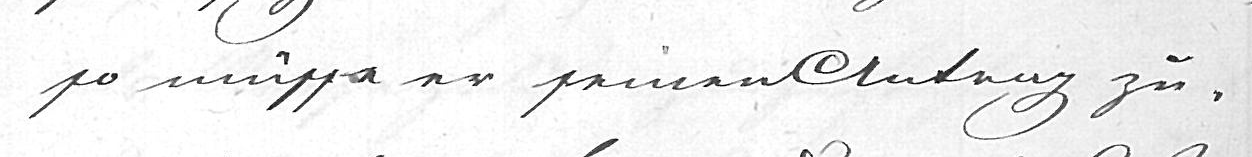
so müsse er seinen Antrag zu-
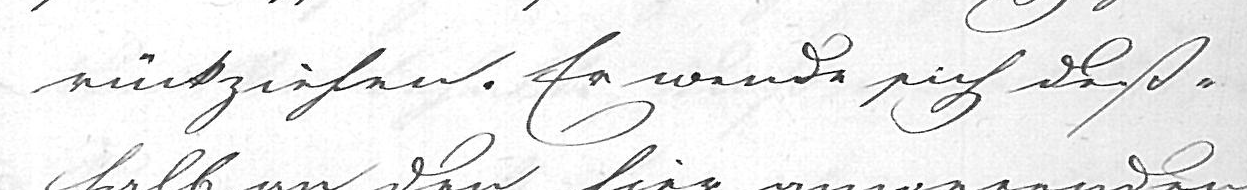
rückziehen. Er wende sich deß-
